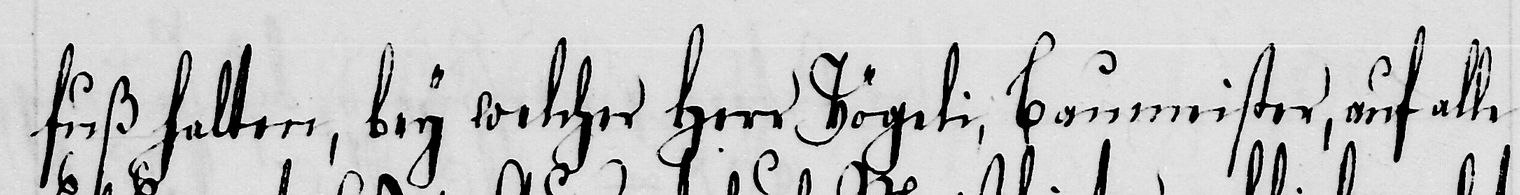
fuß halten, bey welcher Herr Vögeli, Baumeister, auf al¬
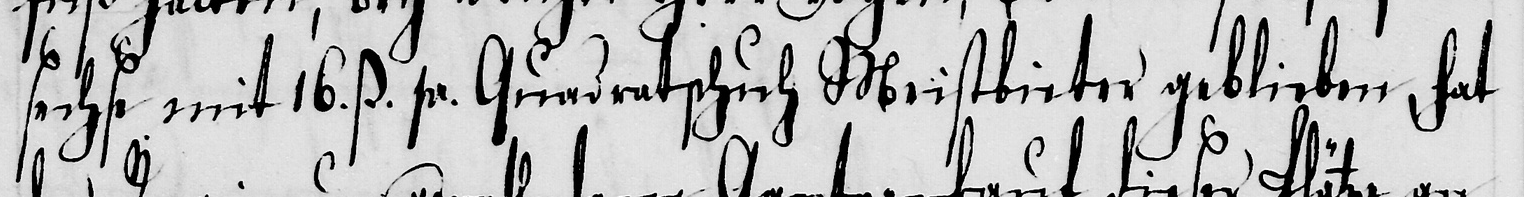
sechse mit 16. ß. pr. Quadratschuh Meistbieter geblieben, hat
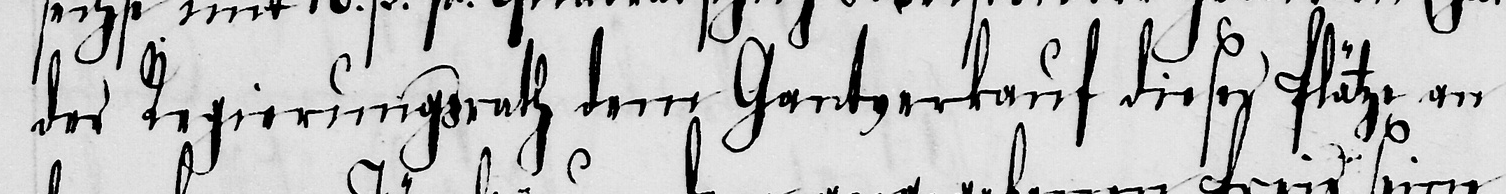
der Regierungsrath dem Gantverkauf dieser Plätze an
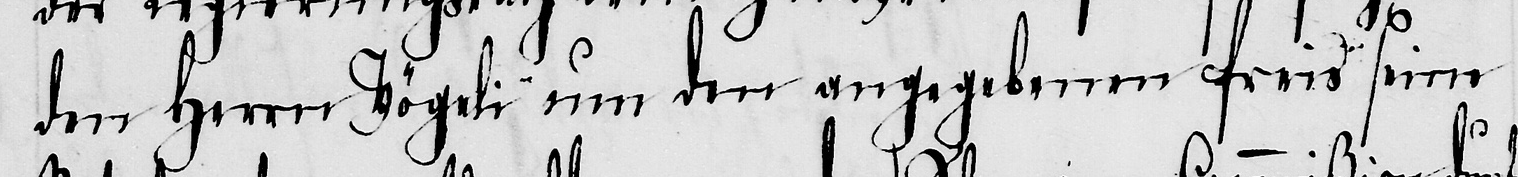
den Herrn Vögeli um den angegebenen Preis seine
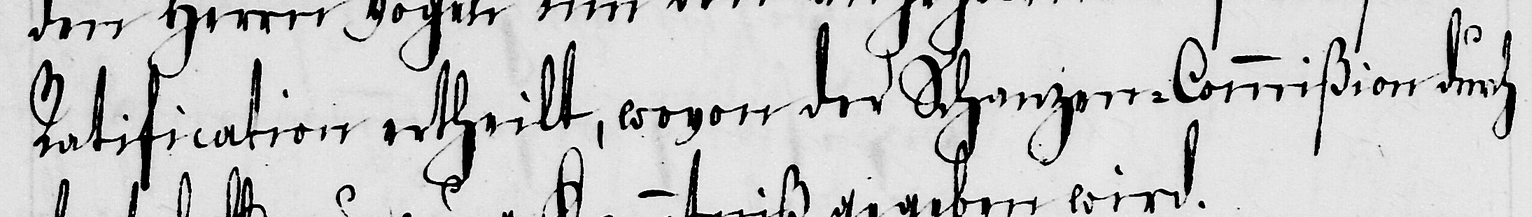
Ratification ertheilt, wovon der Schanzen-Commißion dur¬
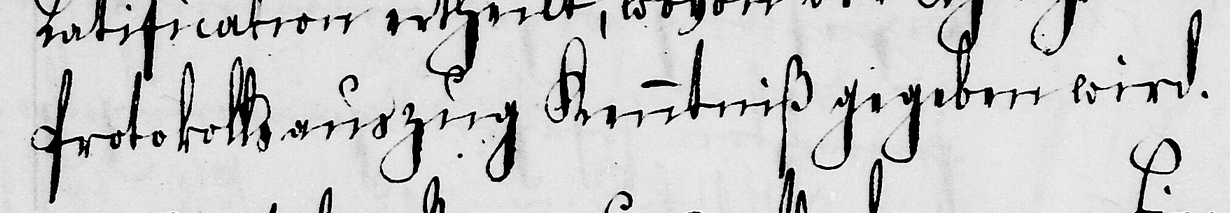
Protokollsauszug Kenntniß gegeben wird.
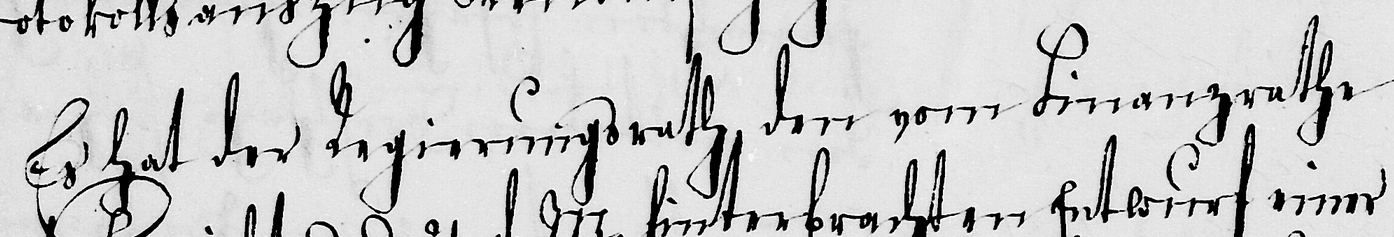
Es hat der Regierungsrath, den vom Finanzrathe
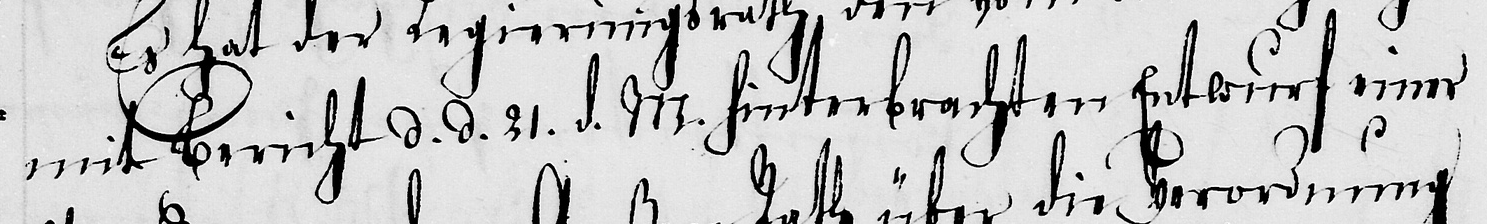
mit Bericht d. d. 21. d. M. hinterbrachten Entwurf einer
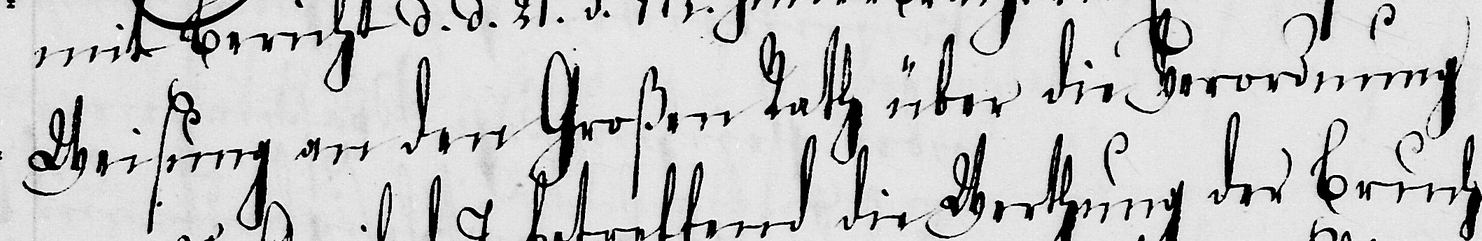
Weisung an den Großen Rath über die Verordnung
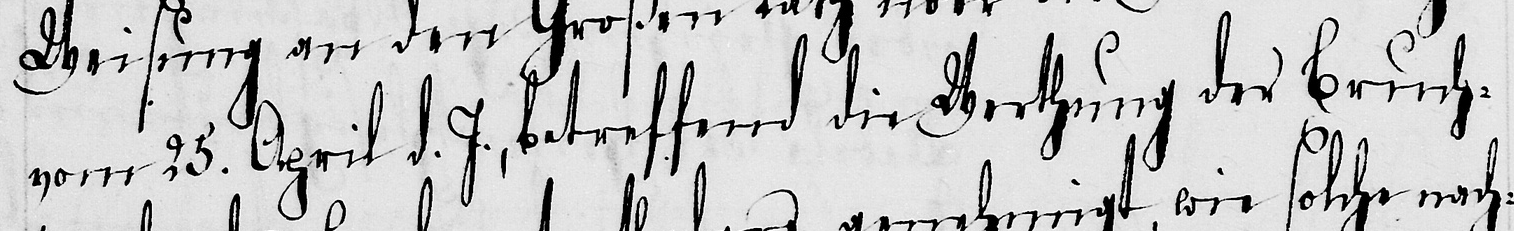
vom 25. April d. J. betreffend die Werthung der Bruch¬
